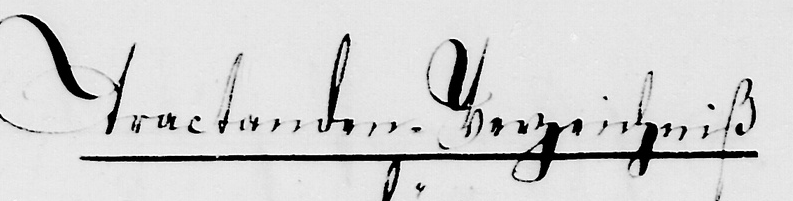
Tractanden-Verzeichniß
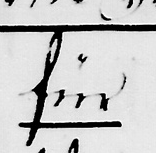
für
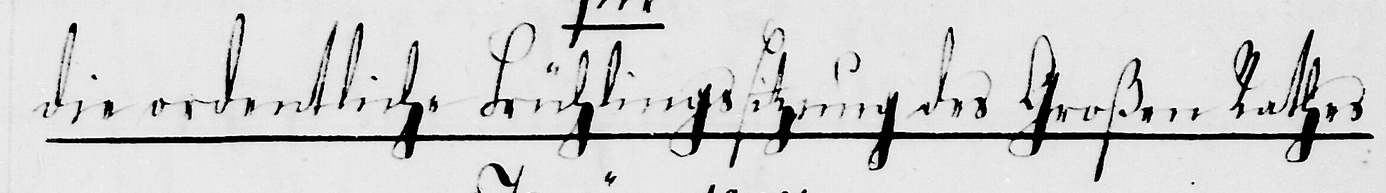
die ordentliche Frühlingssitzung des Großen Rathes
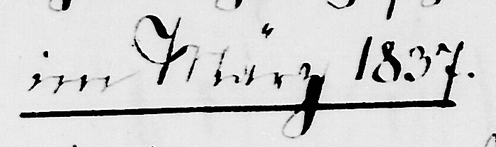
im März 1837.
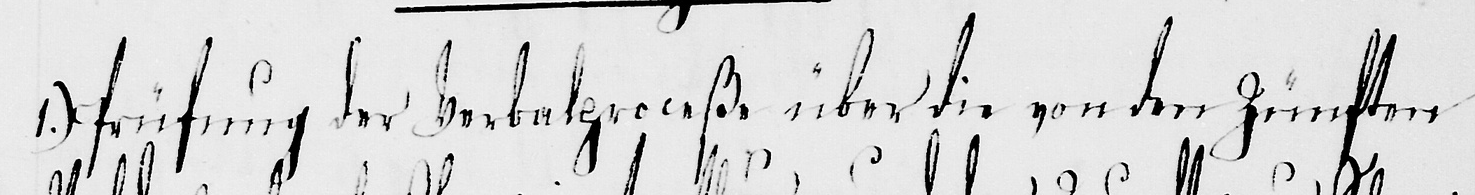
Prüfung der Verbalproceße über die von den Zünften
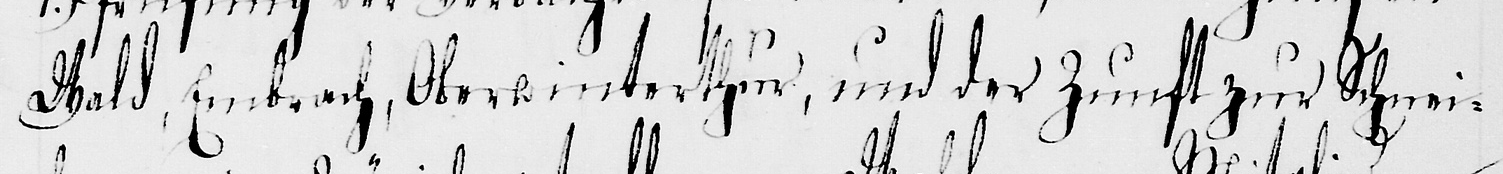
Wald, Embrach, Oberwinterthur, und der Zunft zur Schnei¬
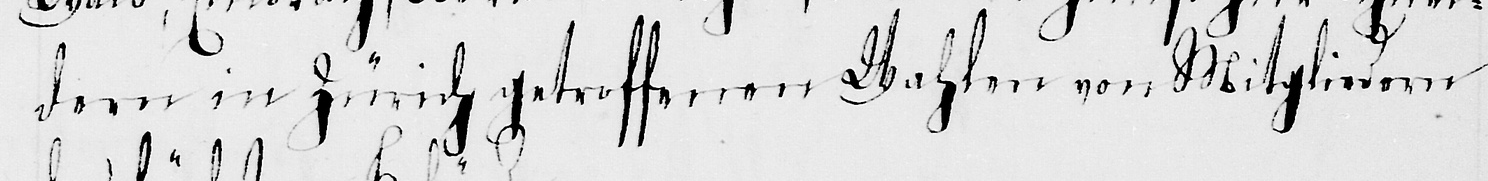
dern in Zürich getroffenen Wahlen von Mitgliedern
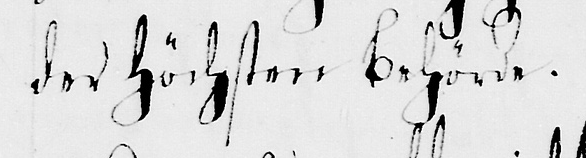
der Höchsten Behörde.
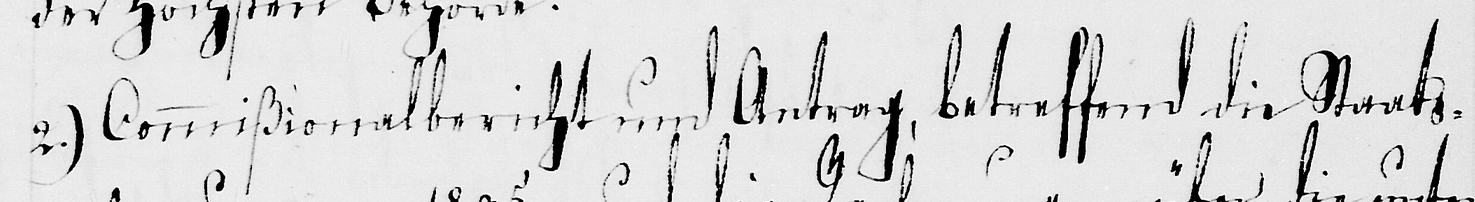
2.) Commißionalbericht und Antrag, betreffend die Staats¬
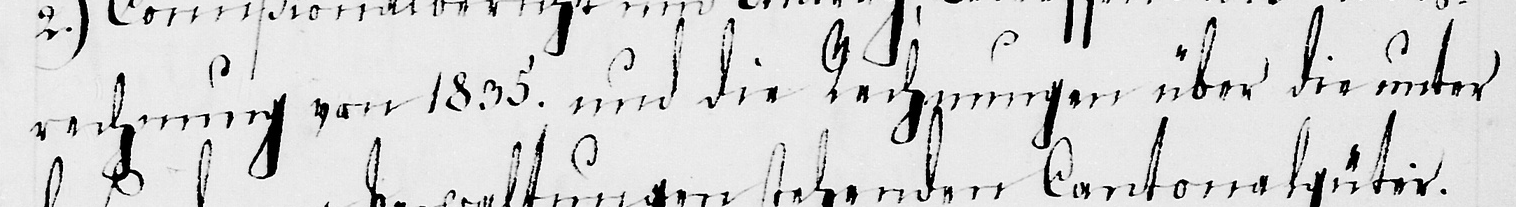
rechnung von 1835. und die Rechnungen über die unter
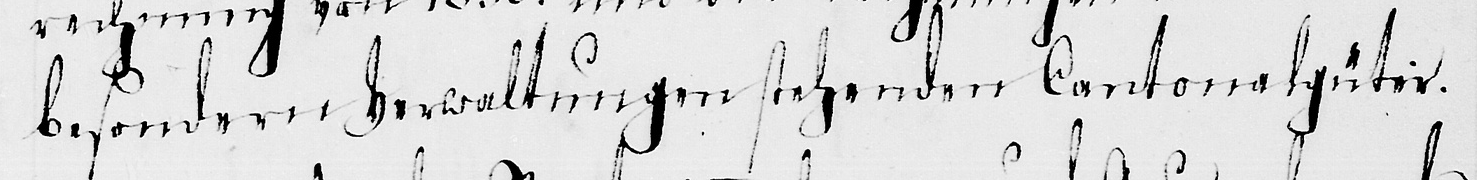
besondern Verwaltungen stehenden Cantonalgüter.
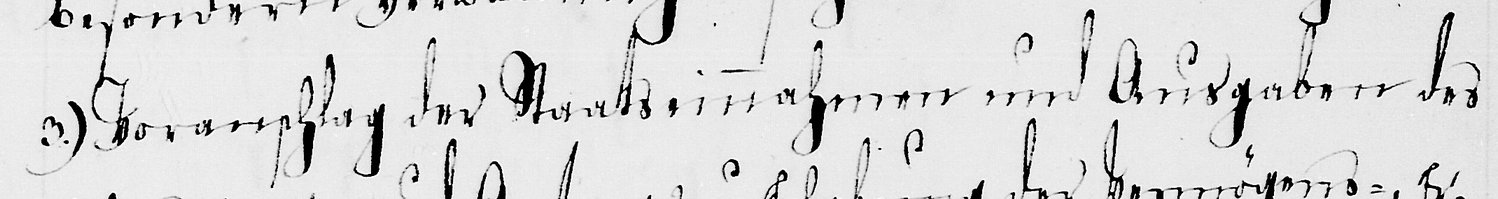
3.) Voranschlag der Staatseinnahmen und Ausgaben des
